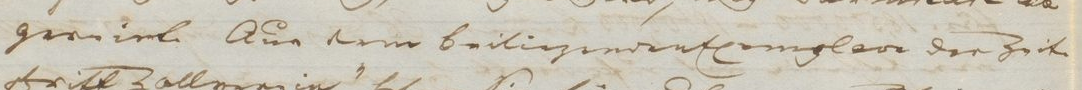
gereist. Aus dem beiliegenden Exemplare der Zeit-
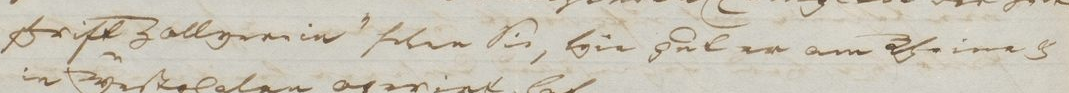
schrift «Zollverein» sehen Sie, wie gut er am Rheine &
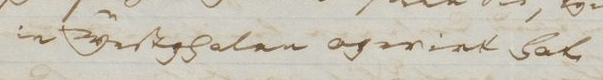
in Westphalen operirt hat.
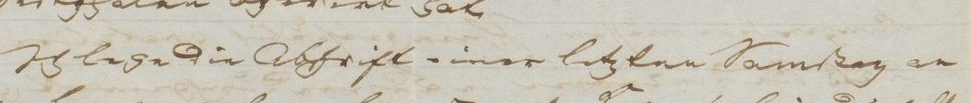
Ich lege die Abschrift einer letzten Samstag an
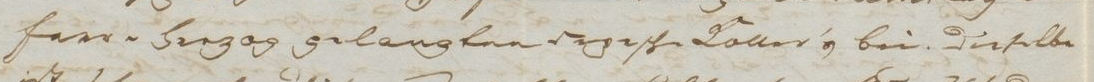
Feer-Herzog gelangten Depesche Koller's bei. Dieselbe
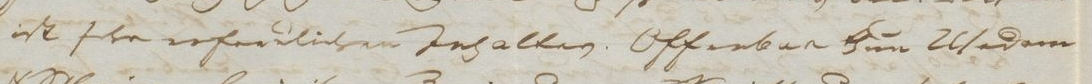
ist sehr erfreulichen Inhaltes. Offenbar thun Usedom
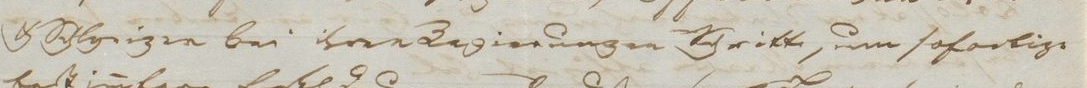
& Schweizer bei ihren Regierungen Schritte, um sofortige
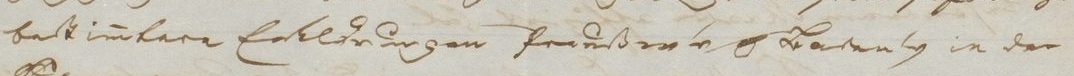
bestimmtere Erklärungen Preußen's &Baden's in der
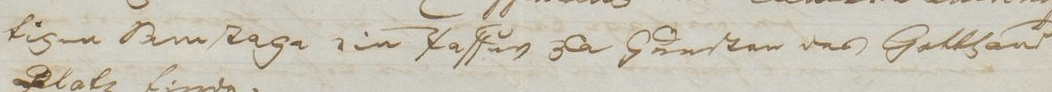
tigen Samstage ein Passus zu Gunsten des Gotthard
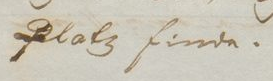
Platz finde.
